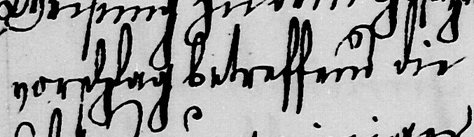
vorschlag betreffend die
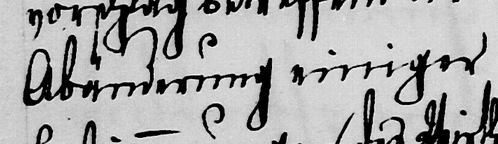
Abänderung einiger
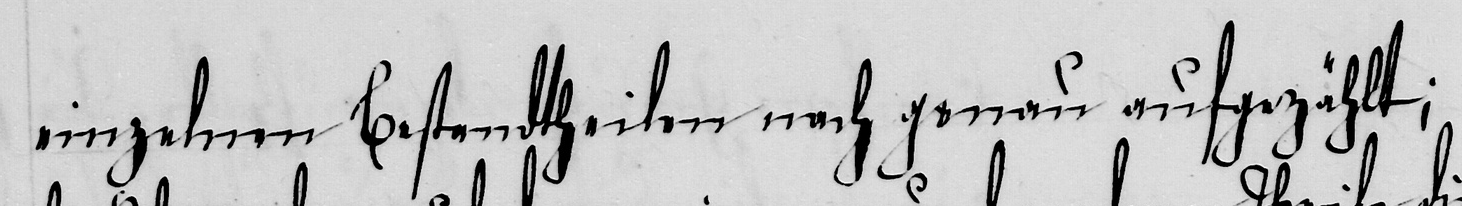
einzelnen Bestandtheilen nach genau aufgezählt;
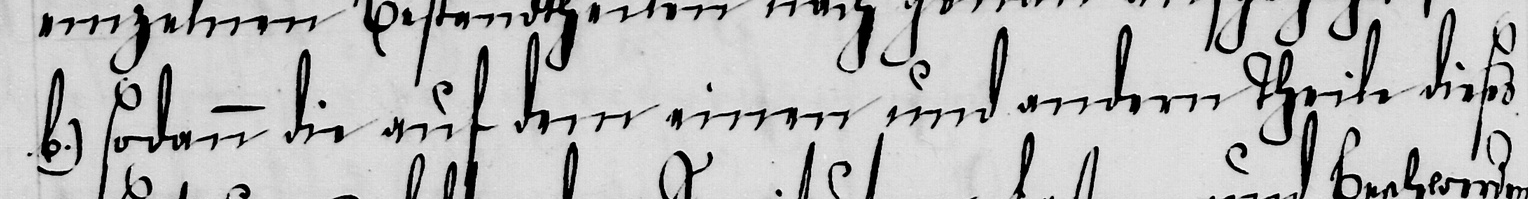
b.) sodann die auf dem einen und andern Theile dieses
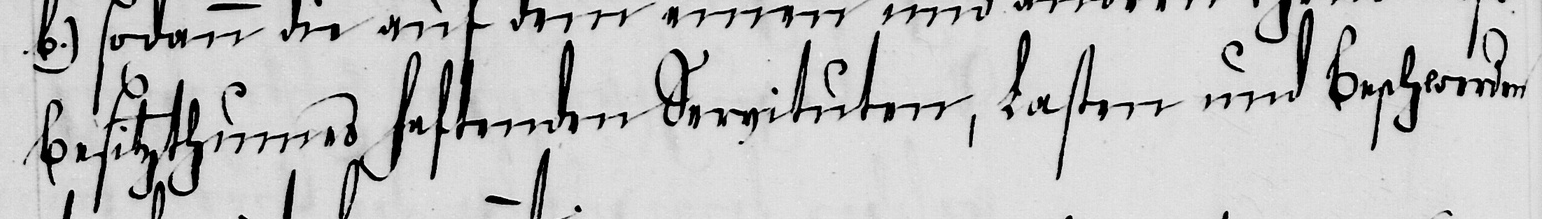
Besitzthumes haftenden Servituten, Lasten und Beschwerd¬
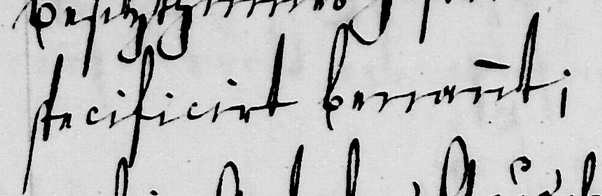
specificirt benannt;
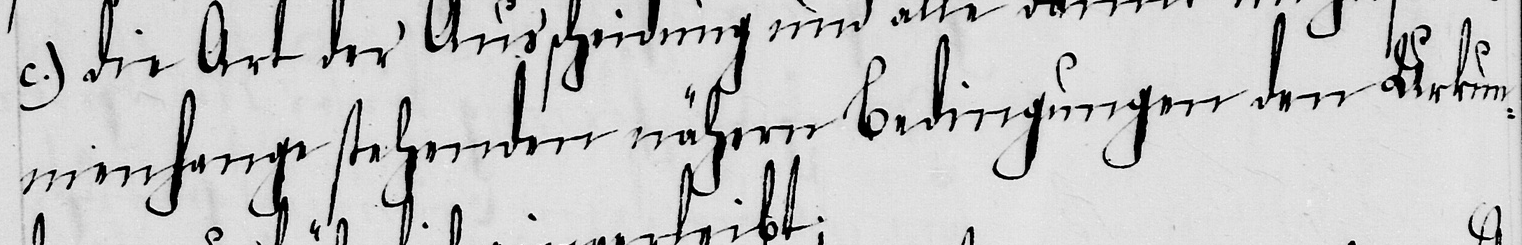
menhange stehenden nähern Bedingungen den Urkun¬
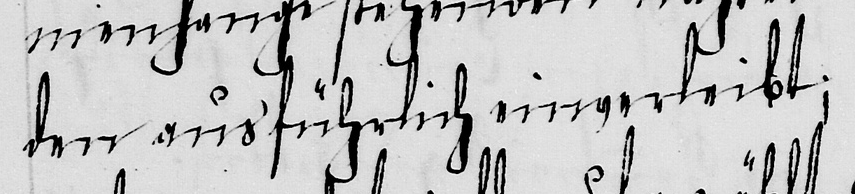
den ausführlich einverleibt;
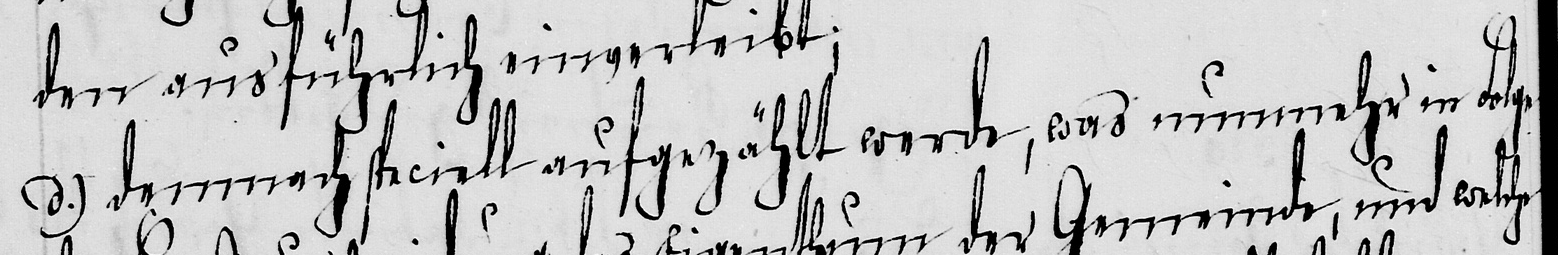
d.) demnach speciell aufgezählt werde, was nunmehr in Fol¬
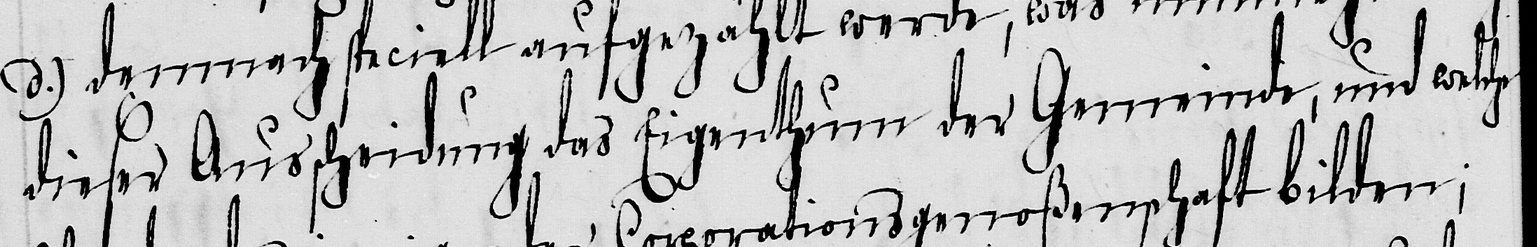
dieser Ausscheidung das Eigenthum der Gemeinde, und welc¬
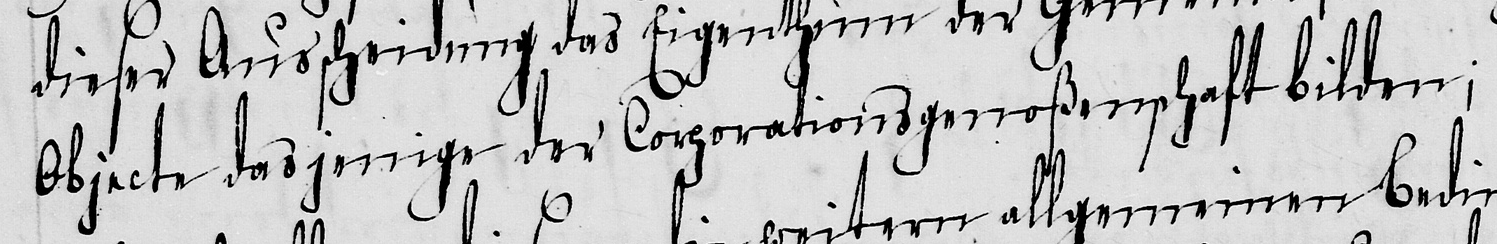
Objecte dasjenige der Corporationsgenoßenschaft bilden;
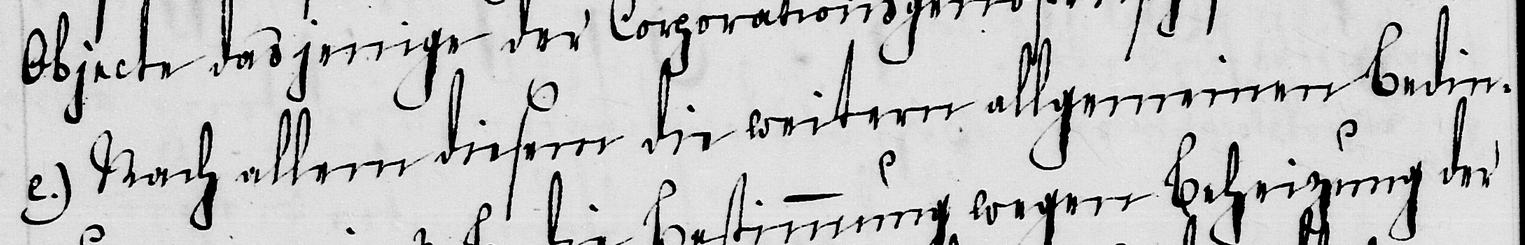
e.) Nach allem diesem die weitern allgemeinen Bedin¬
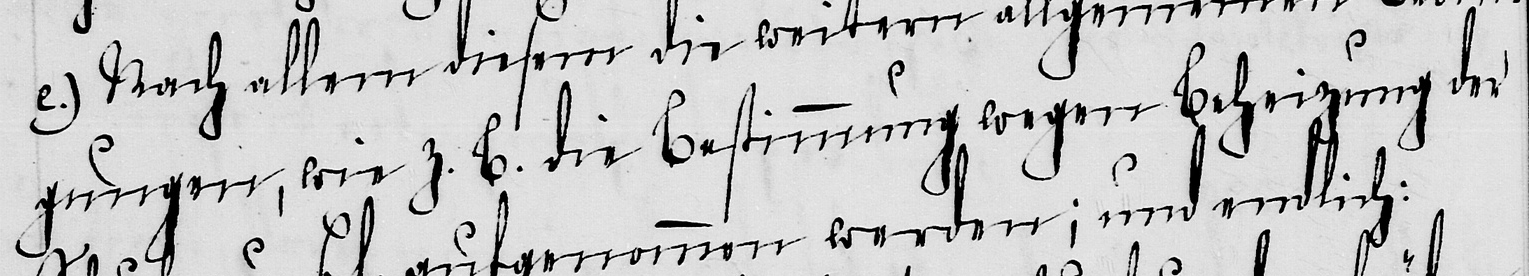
gungen, wie z.B. die Bestimmung wegen Beheizung der
